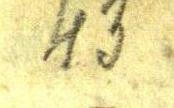43
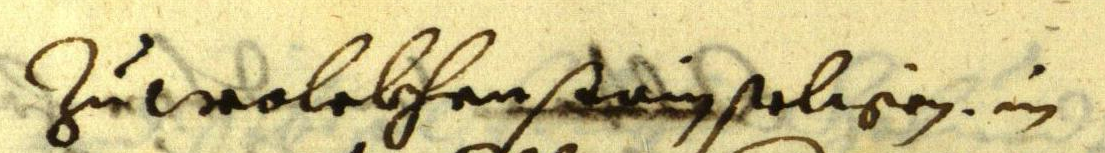Zū wolckhenstain seligen. in
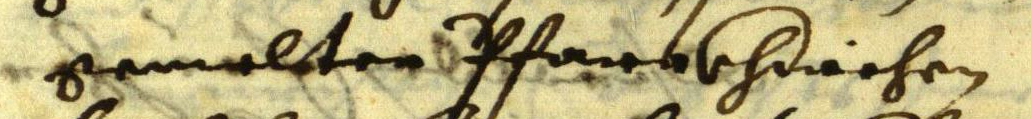gemelter Pfarrkhirchen
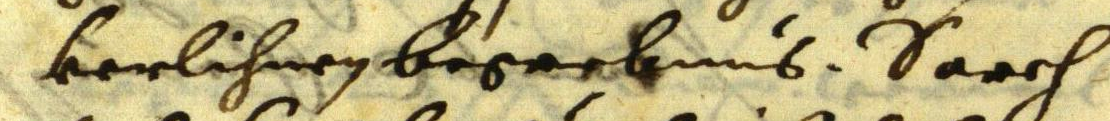verlihnen begrebūng. Sarch
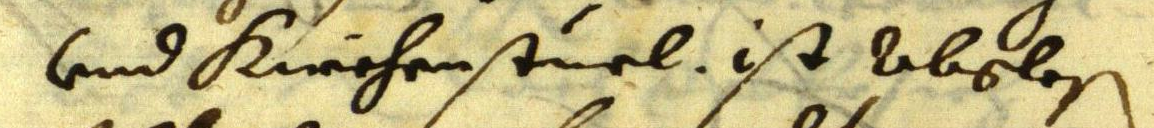vnd Kirchenstūel. ist Abgles.
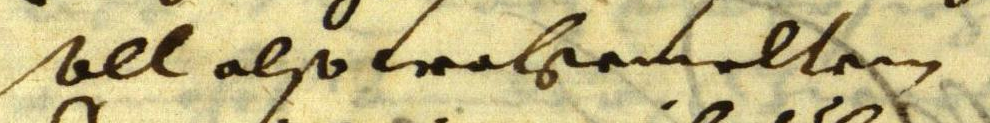soll also wolgemeltem
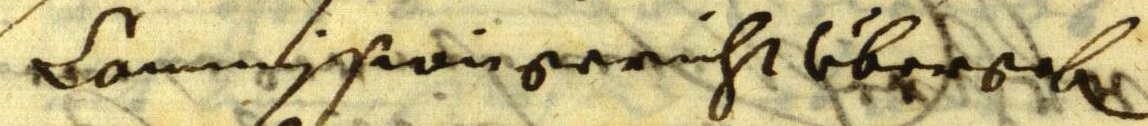Commissiongericht v̄bergeb
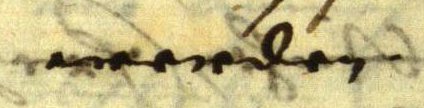werden.
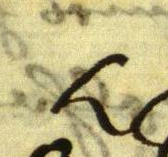t
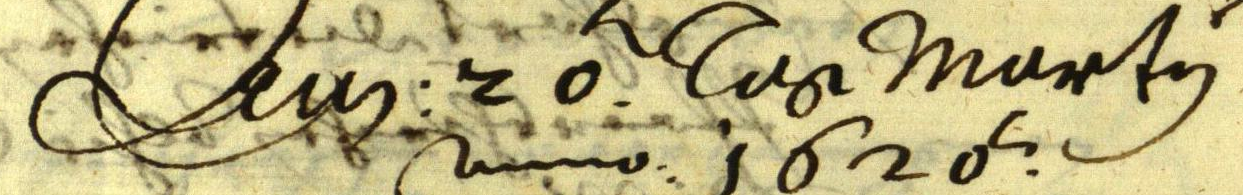Am: 20. Tag Martȳ
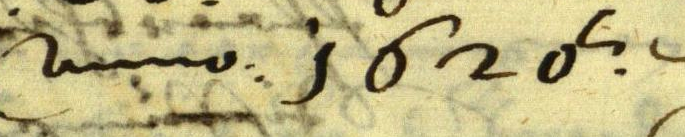Anno: 1620 t.
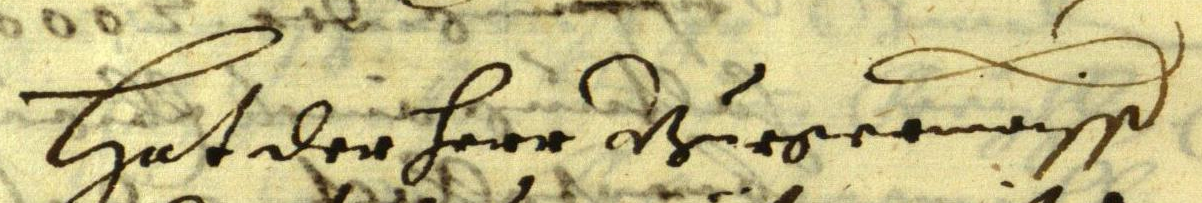Hat der herr Būrgermaisst
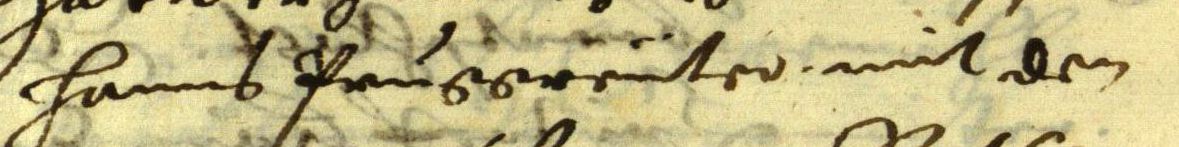hanns Prūggreüter. mit den
